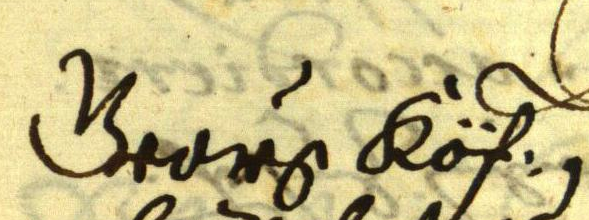Geōrg Köf¬
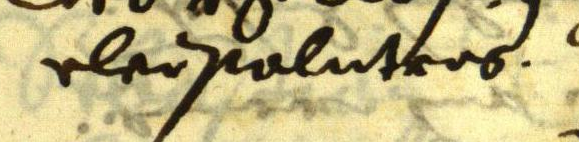eler Palntrag.
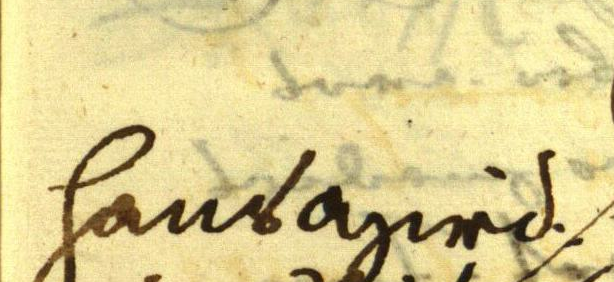Hans Mird¬
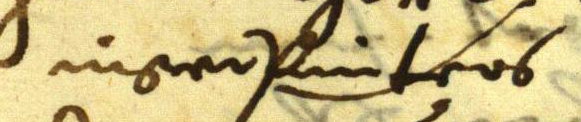inger Pinters
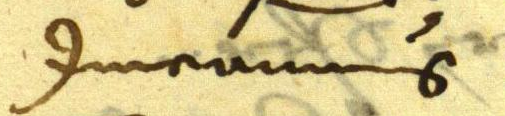Inwonūng
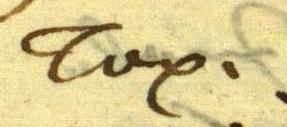Tax.
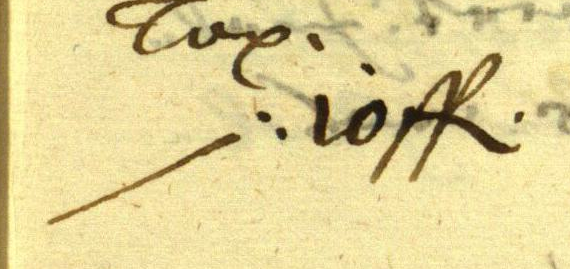—: 10 fl.
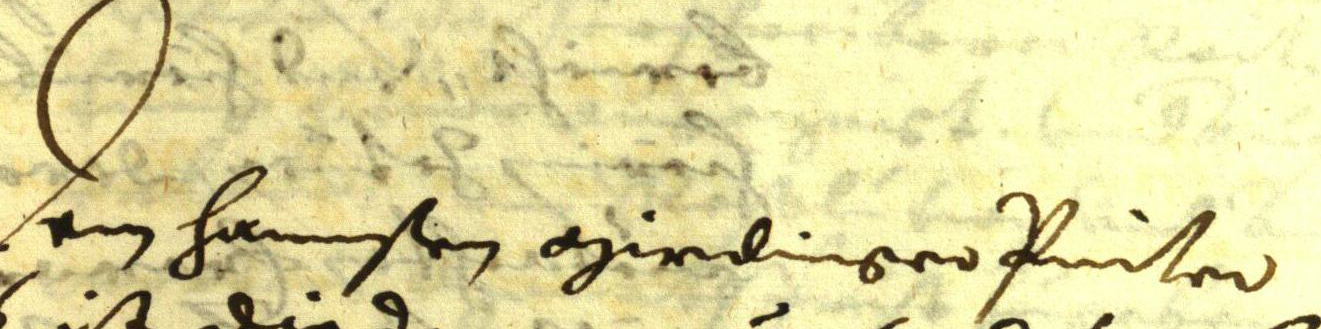Dem hannsen Mirdinger Pinter
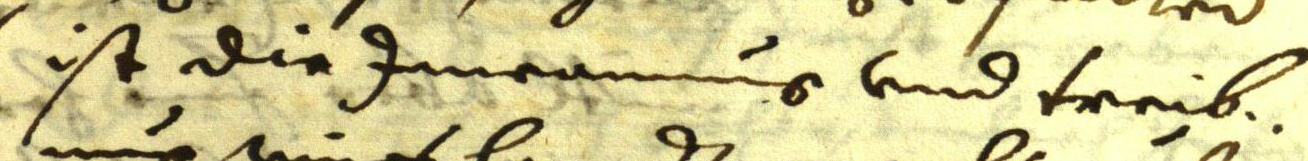ist die Inwonnūng vnd treib¬
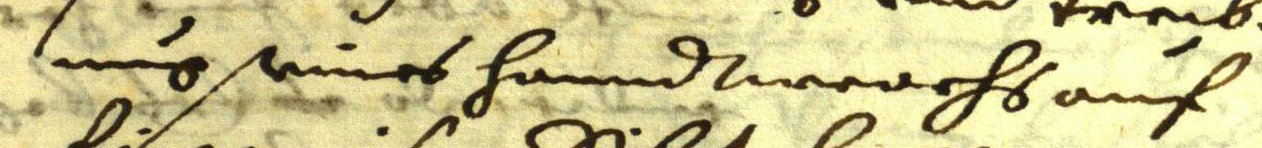ūng seines hanndtwerchs aūf
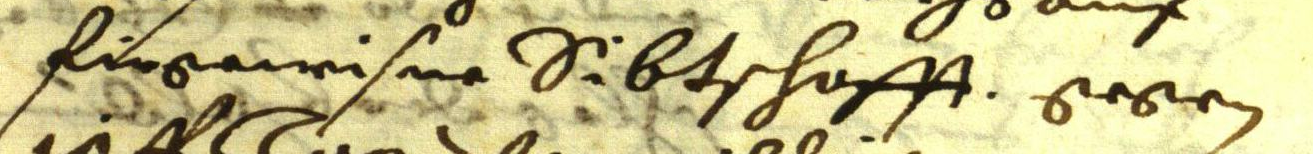firgewisner Sibtschafft. gegen
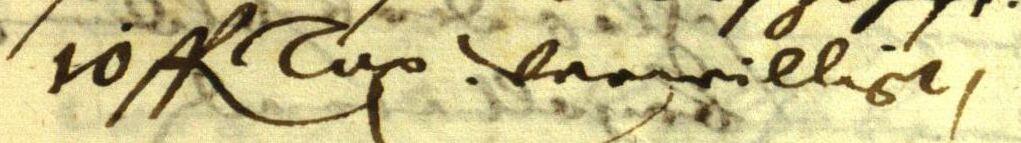10 fl Tax. verwilligt,
